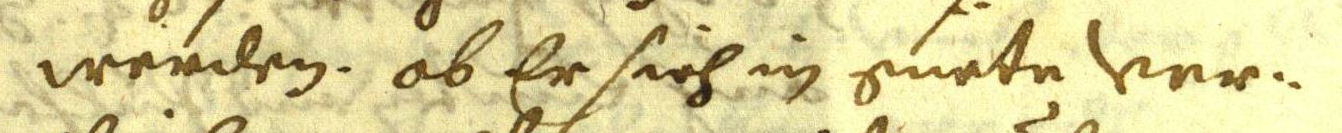werden. ob Er sich in gūete ver¬
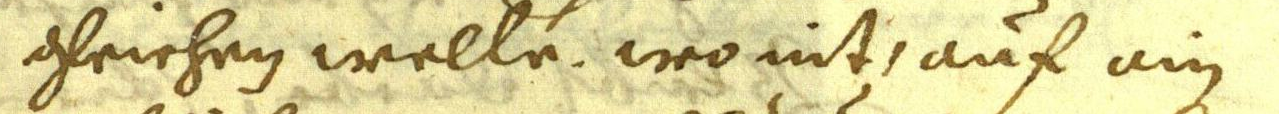gleichen welle. wo nit, aūf ain
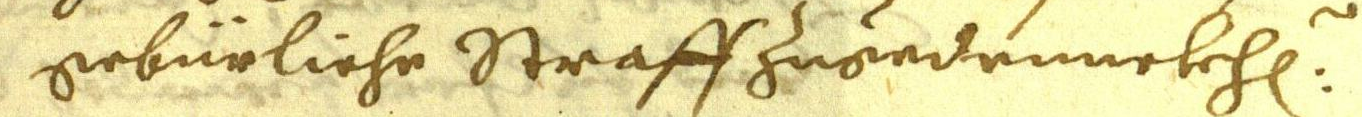gebürliche Straff Zūgedennckh:
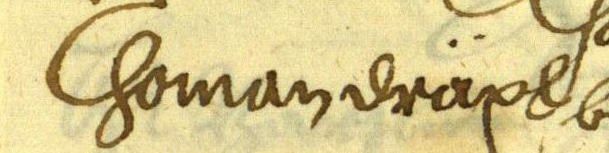Thoman dräxl
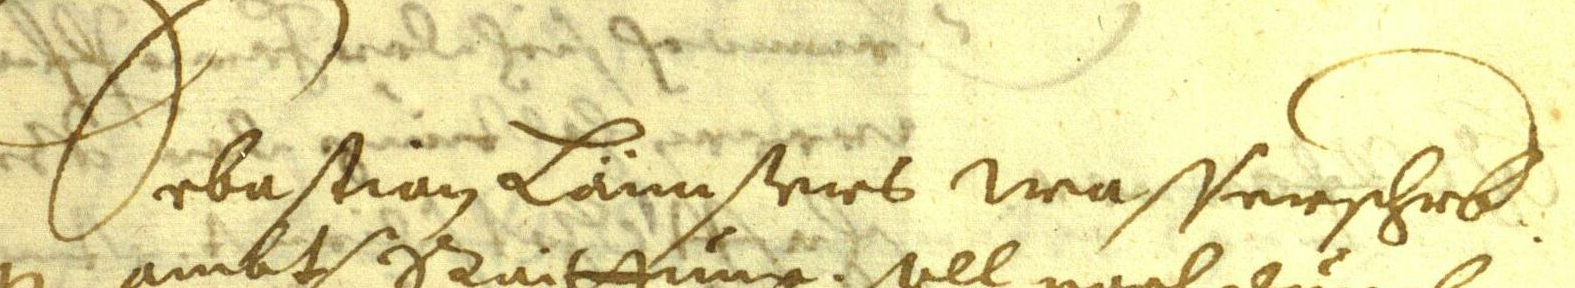Sebastian Lännsers Wasserschrb¬
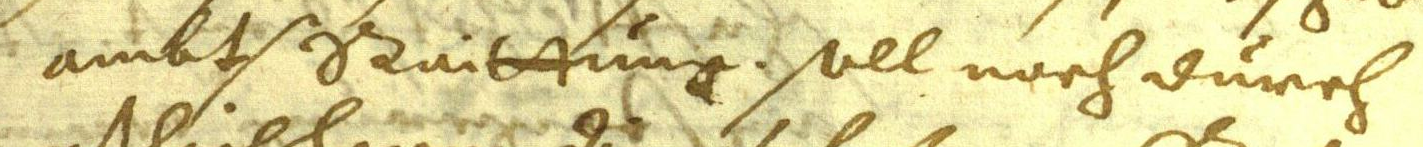ambts Raittūng. soll noch dūrch
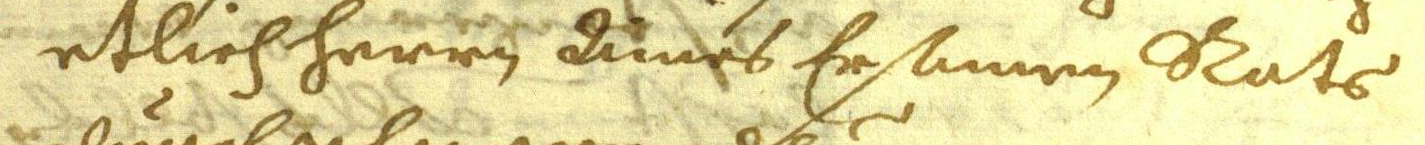etlich herrn Aines Ersamen Rats
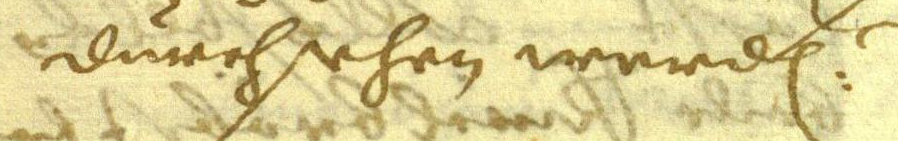dūrchsehen werd.
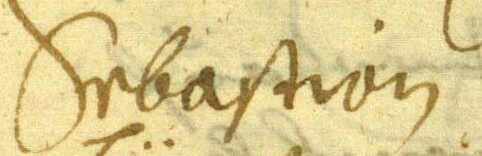Sebastian
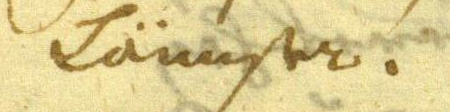Lännser.
